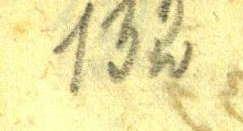132
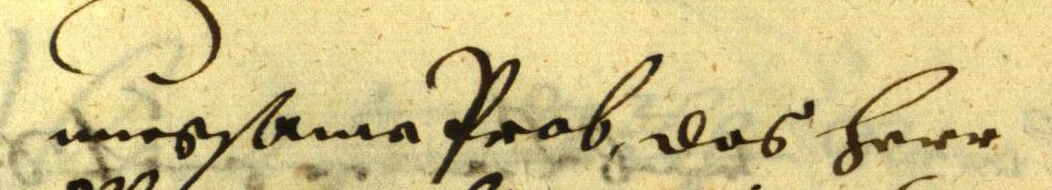nūgsame Prob, das herr
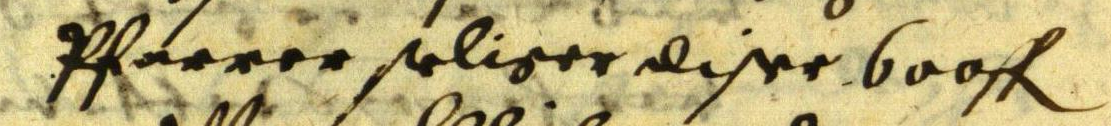Pfarrer seliger diser 600 fl
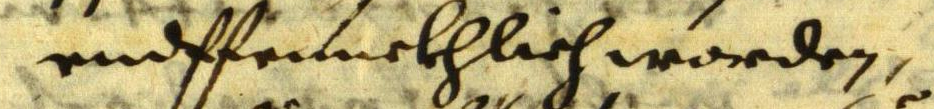endffennckhlich worden,
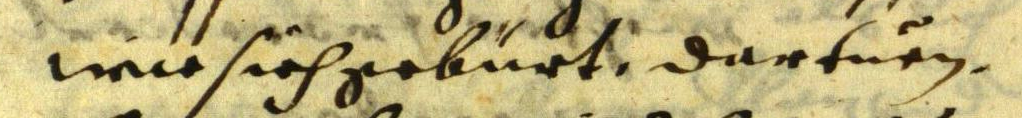wie sich gebürt, dartūen.
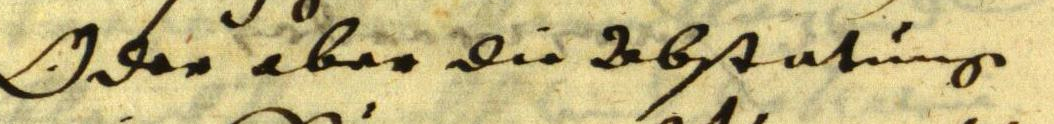Oder aber die Abstatūng
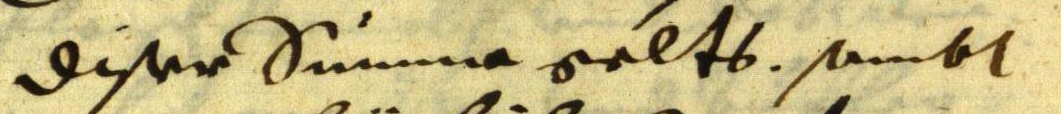diser Sūmma gelts. sambt
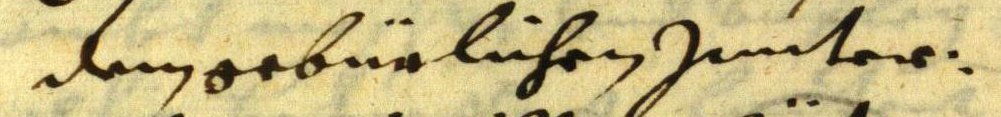dem gebürlichen Innter¬
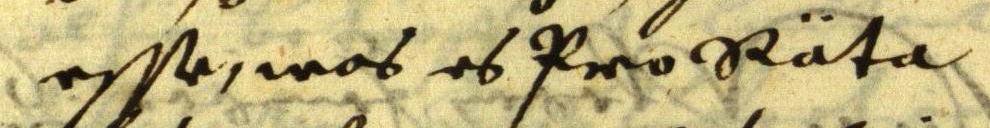esse, was es Pro Räta
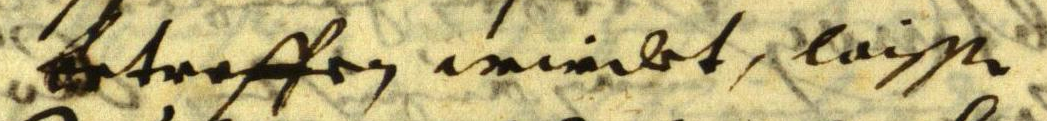ertreffen wirdet, laisst.
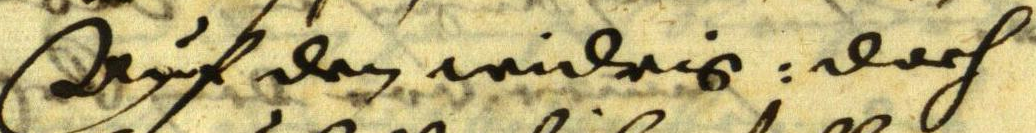Aūf den widrig: doch
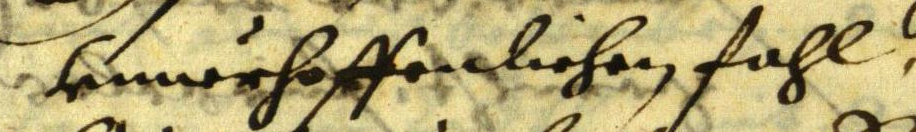Vnūerhoffenlichen fahl
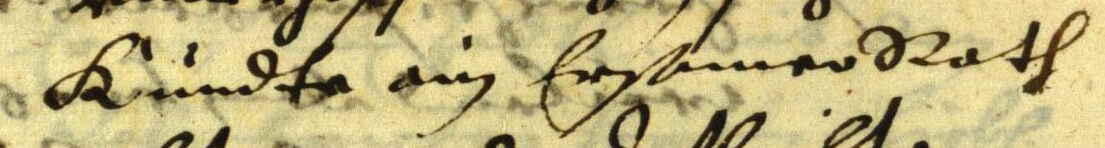kūndte ain Ersamer Rath
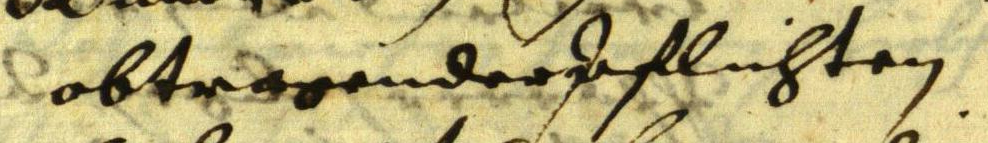obtragender Pflichten
